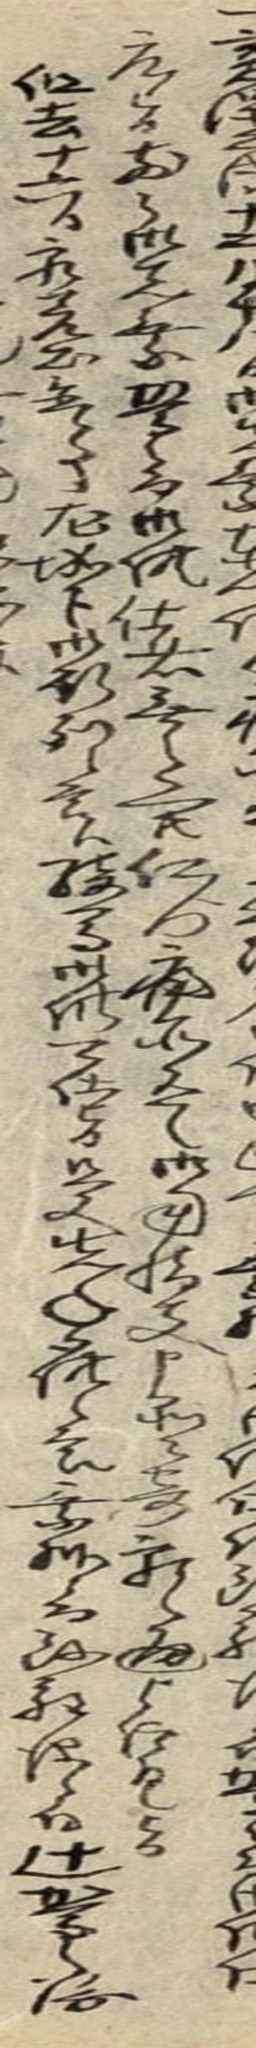但去十六日願差出置候事尤城下御行列之節は駿馬御供可仕旨且又先年御供之節乗掛に而致難儀候付辻駕之儀
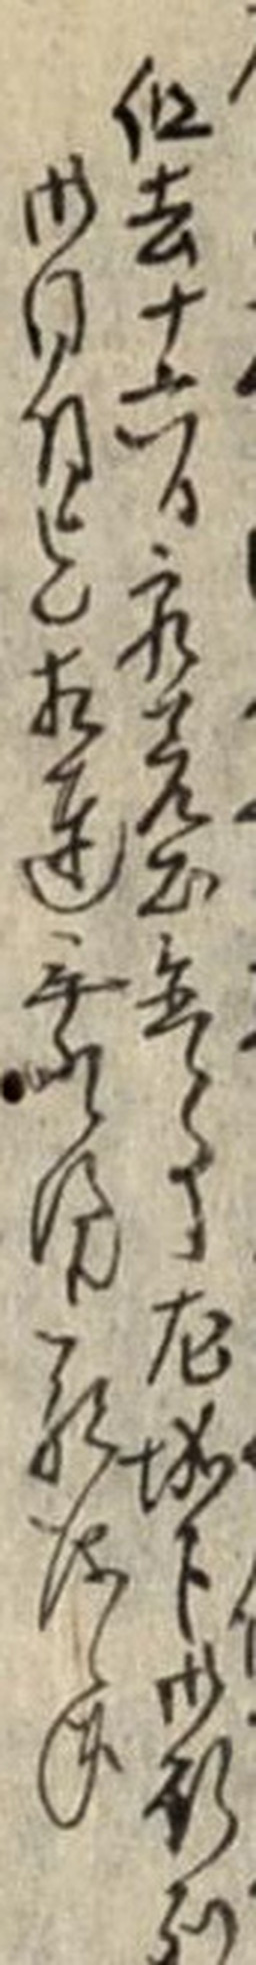御目付迄相達乗候得共難儀之趣
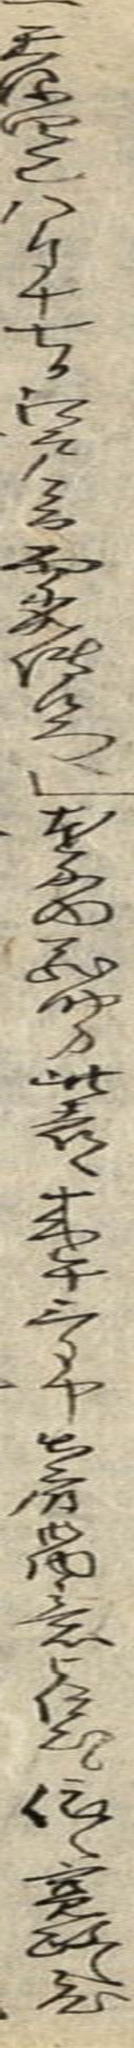一天保四巳八月十七日江戸に而雨森伝左衛門へ」本多内蔵助方此表へ来午三月中出府御内意被仰出候依之寛政之度
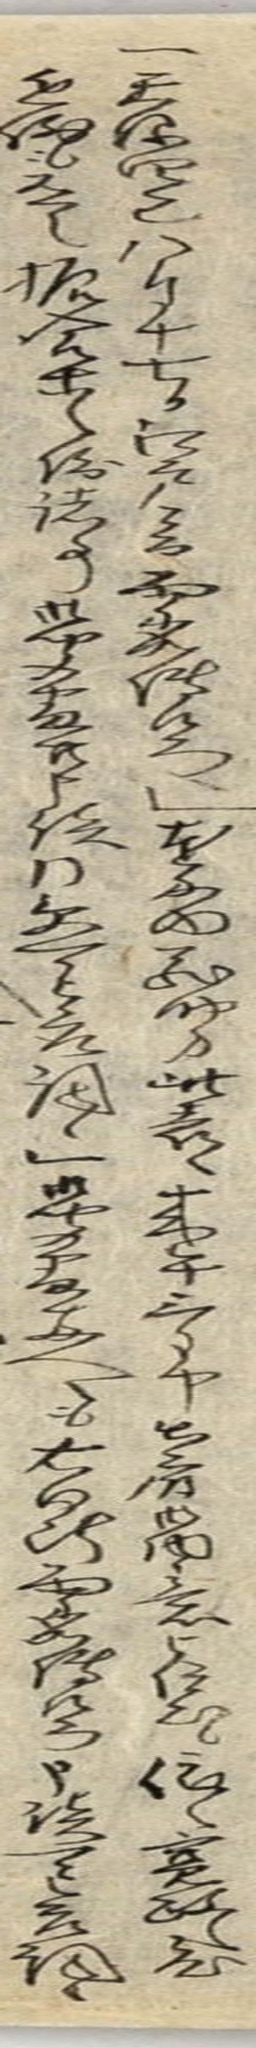近例も有之振合等之儀諸事御聞番共申談引受可被取調候」御聞番両人へも右同断雨森伝左衛門申談可被取調候
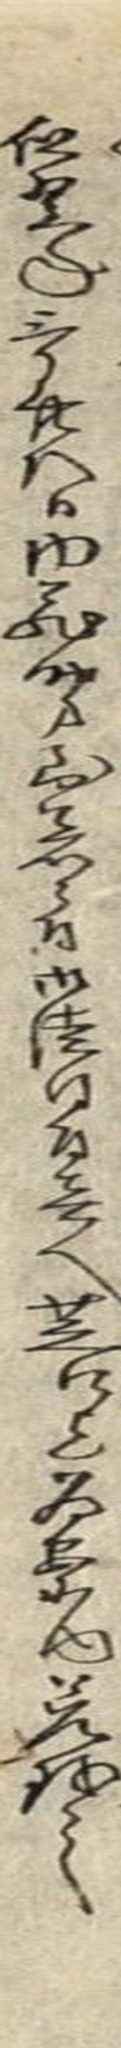但翌年三月廿八日内蔵助方到着に付御徒目付壱人芝口迄為案内差越之
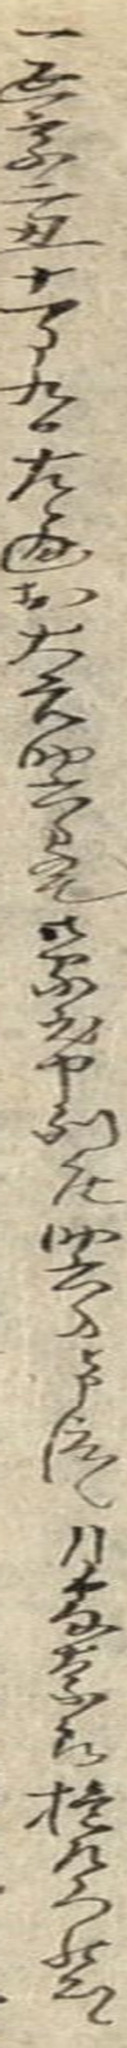一延享二丑十一月九日左之通於大谷助六方宅御家老中列座助六方被申渡之月番奈良権左衛門罷出候
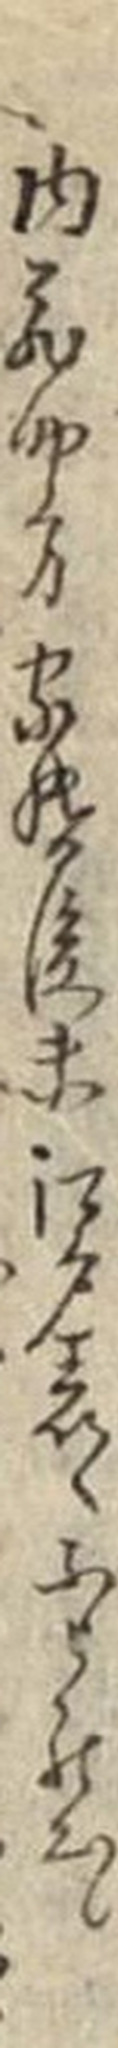内蔵助方家督後未江戸表へ不被罷出候
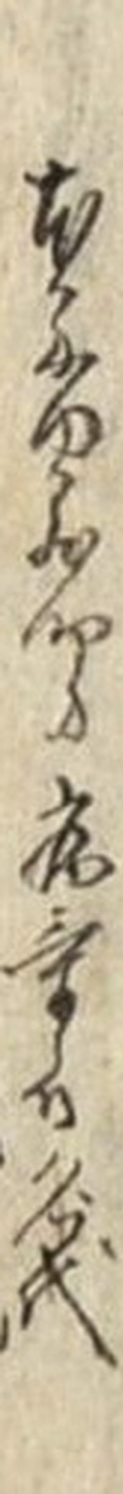本多内蔵助方病気に付名代
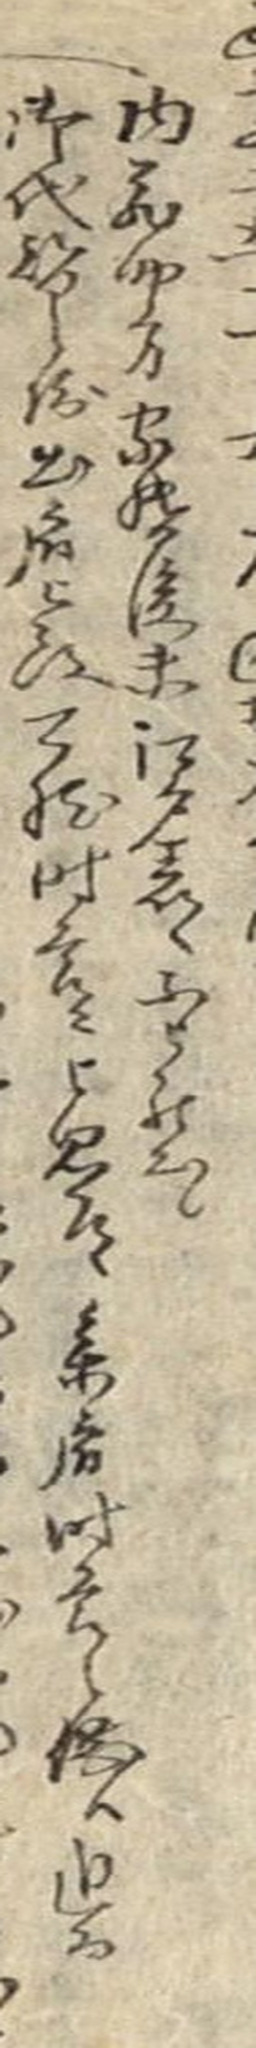御代替之儀出府被致可然時節に被思召候参府時節之儀は追而
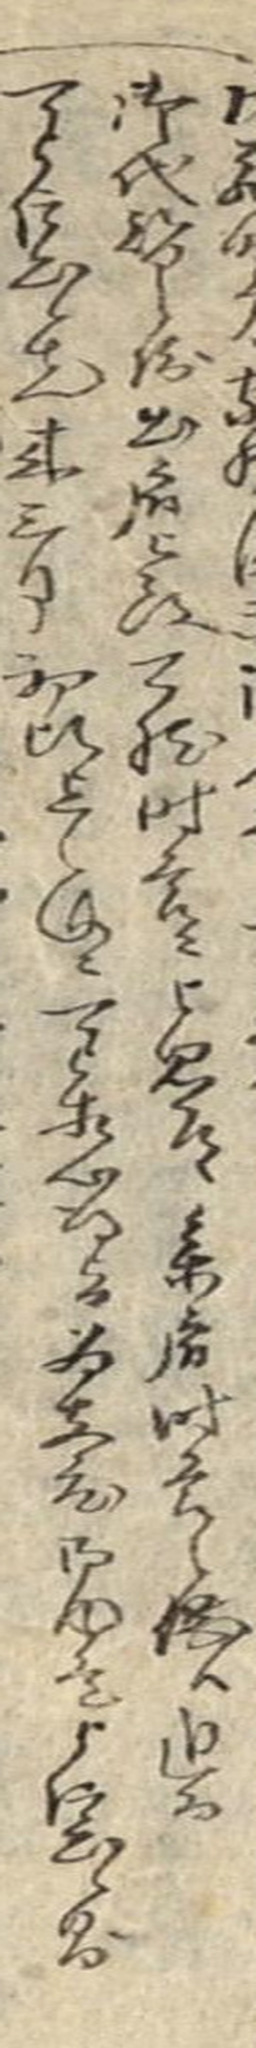可被仰出候先来三月初頃迄之趣に可被相心得旨為支度御内意被仰出候則
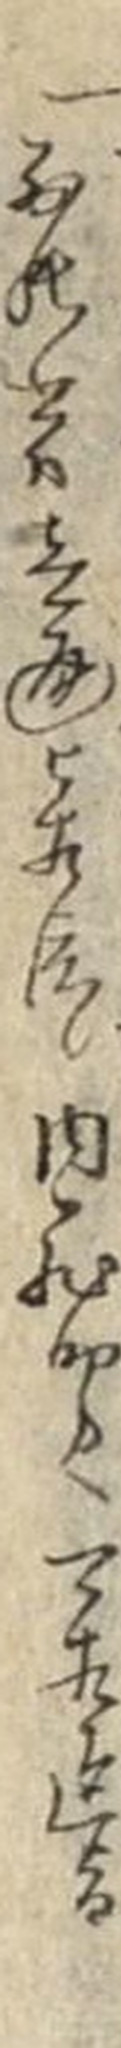別紙書付壱通被相渡候内蔵助方へ可相達旨
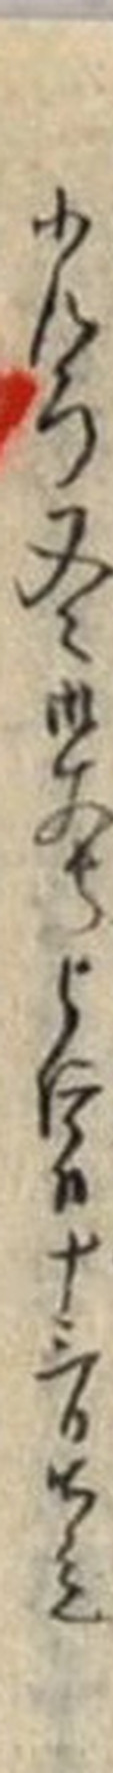小左衛門又々御使者被仰付十三日出立

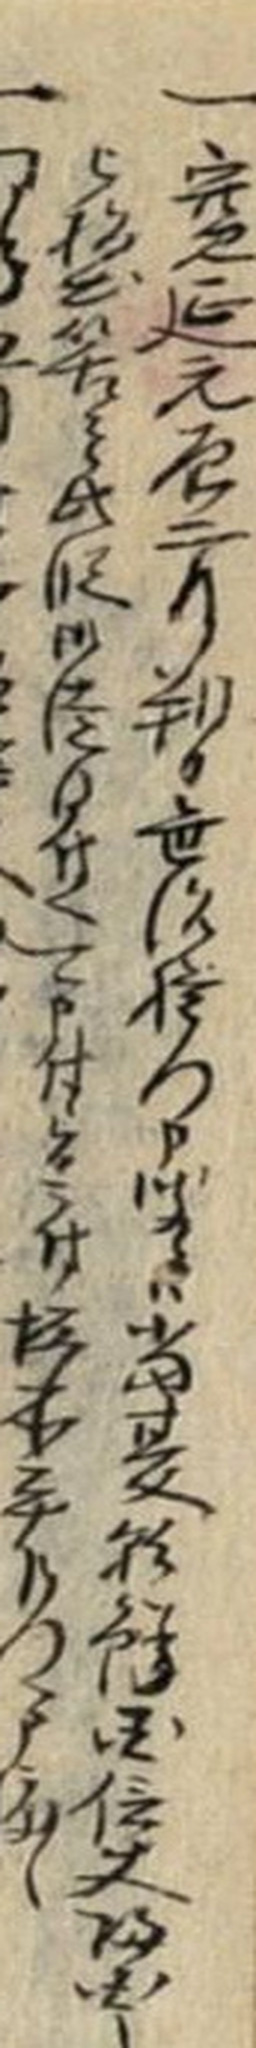被指出筈に候此段御徒目付へ可申付旨に付坂本平左衛門へ申渡候
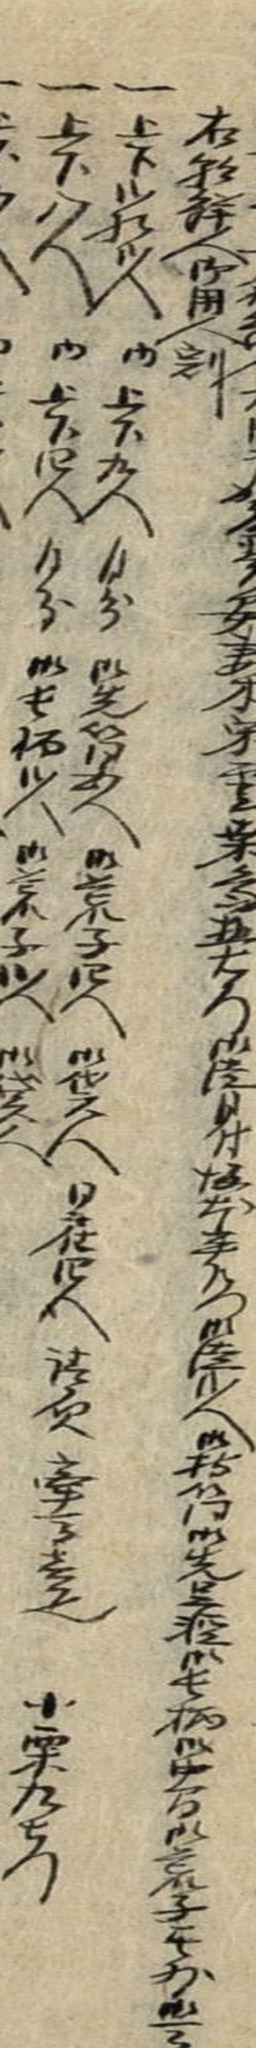一上下弐拾弐人内上下九人自分御先筒五人御荒子四人御貸人日雇四人請負牽馬壱疋小栗九右衛門
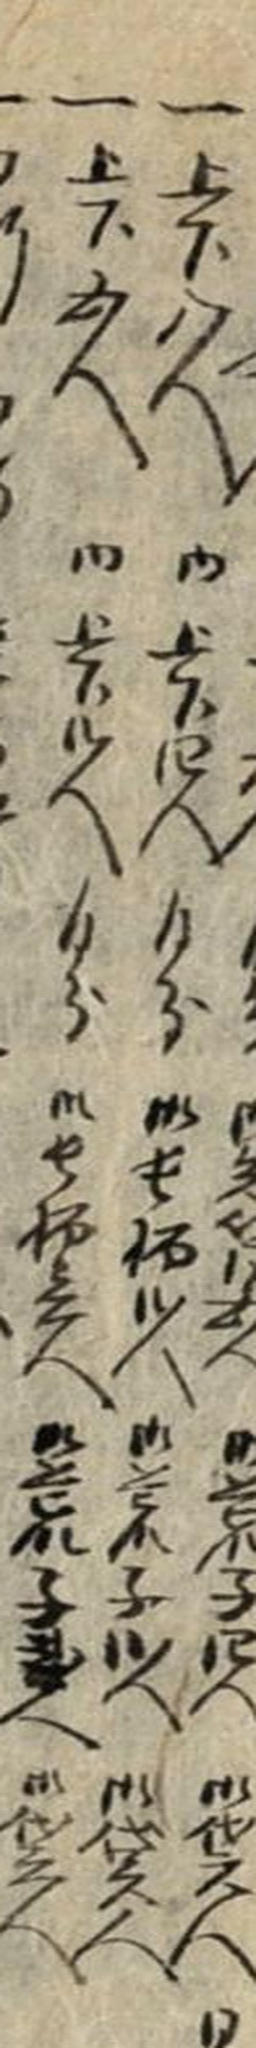一上下八人内上下四人自分御長柄弐人御荒子弐人御貸人井原源兵衛

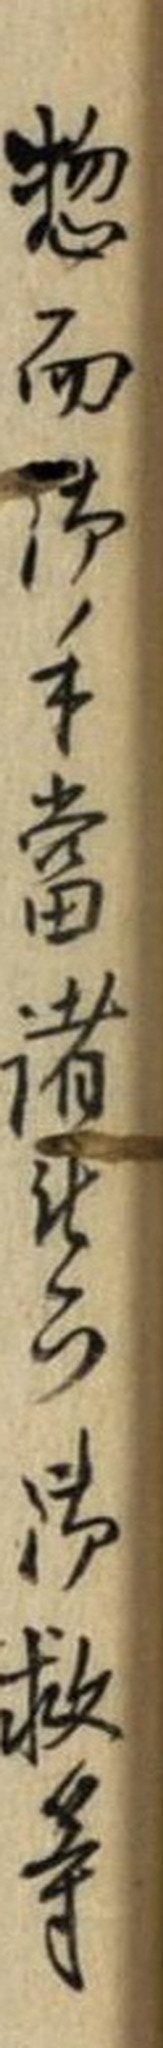惣而御手当諸被下御救等
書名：御用并被仰出之部
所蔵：福井県文書館 Fukui Prefectural Archives
